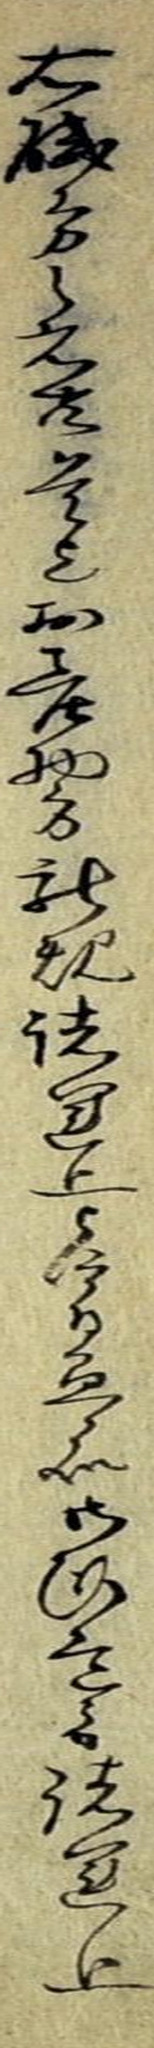右職方之者共是迄於産物方新規諸運上被仰付置候処御趣意ニ付諸運上
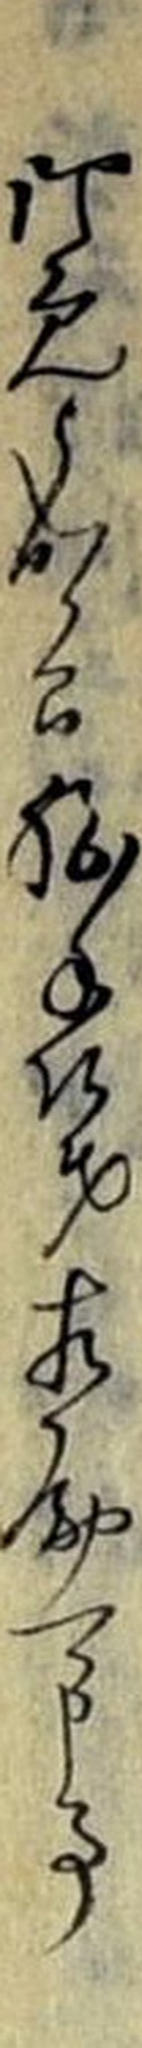御免被成候間勝手次第相勤可申事
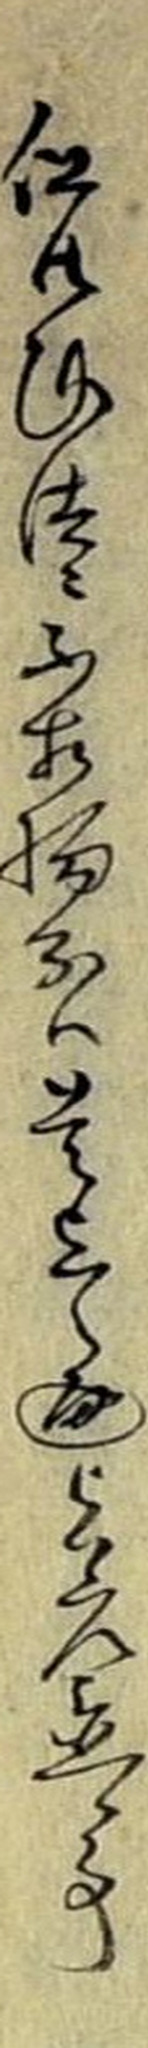但御趣法ニ不拘分ハ是迄之通被差置候事
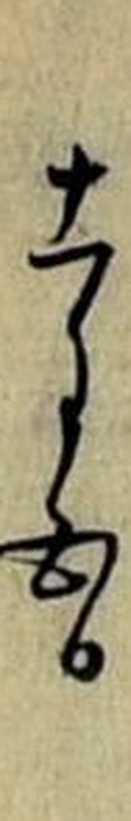十一月五日
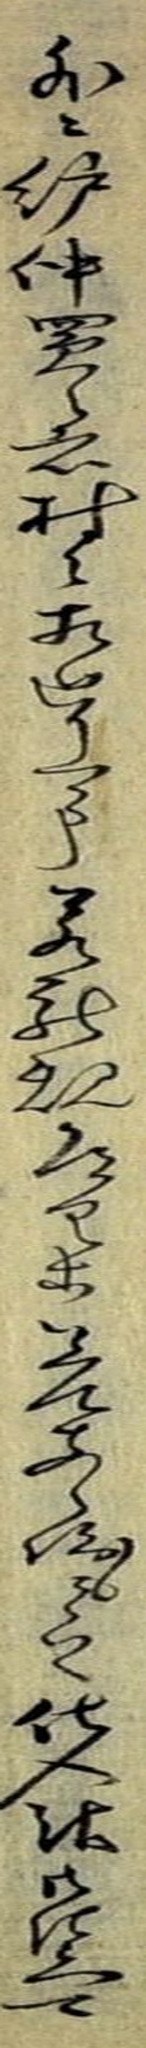外ニ䋆仲買之者村々相廻り可申若新規道具等差支候儀も候ハヽ仕入銀御貸可
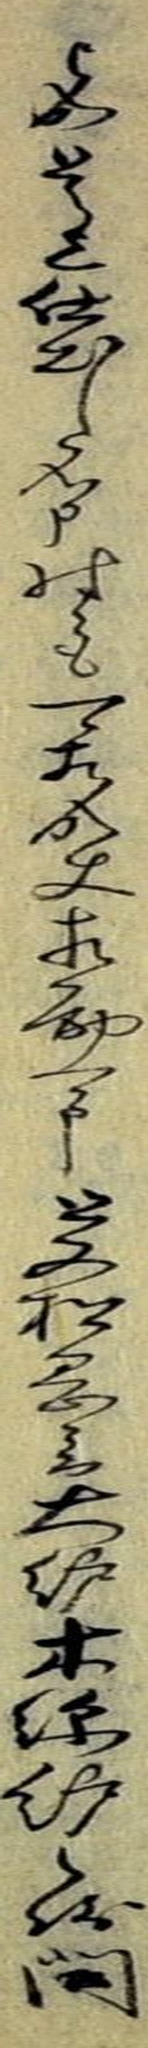被成是迄仕出し不申付にも可相成丈相勤可申と又松岡ニ而大䋆木綿䋆之儀問
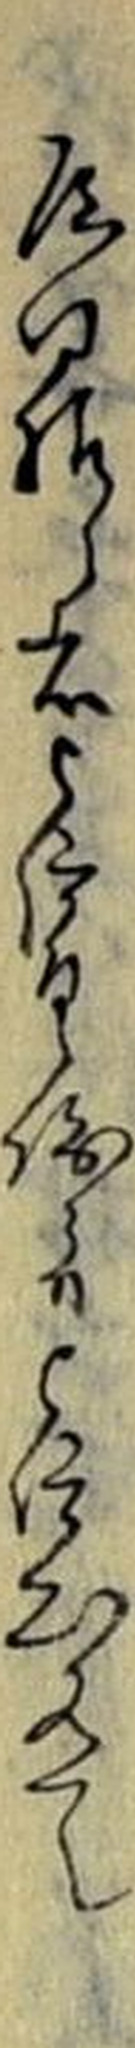屋同様之者被仰付候儀ニ付被仰出有之
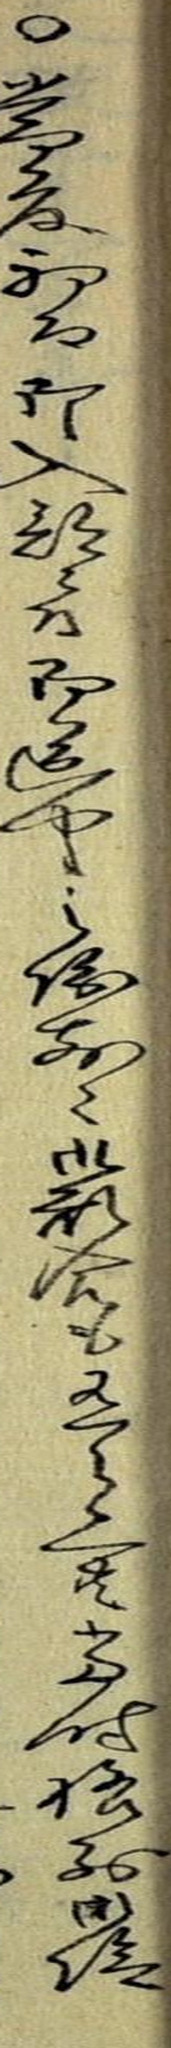○当夏初而御入部御道中之儀前々御形合も有之候へ共当時格別御倹
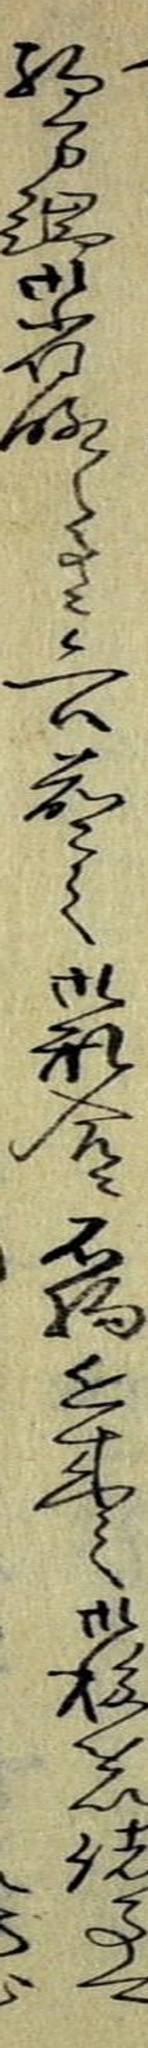約万端御省略之事ニ候へハ前々之御形合ニ不拘近来之御移を以諸事可
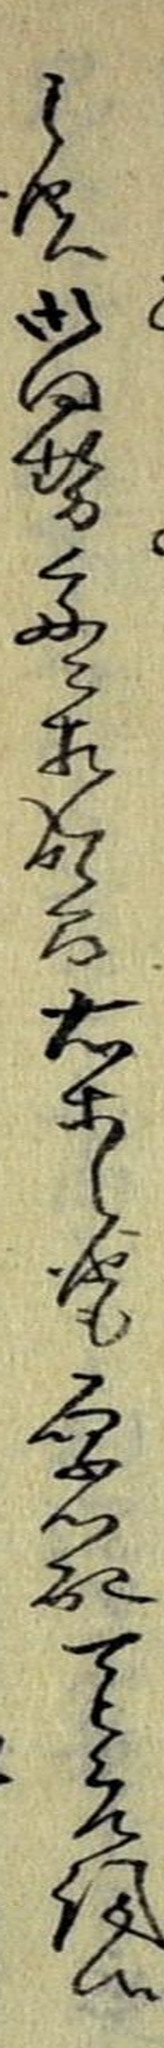之儀ハ御同勢多々相成候間右等之儀も厚心配可被取調候
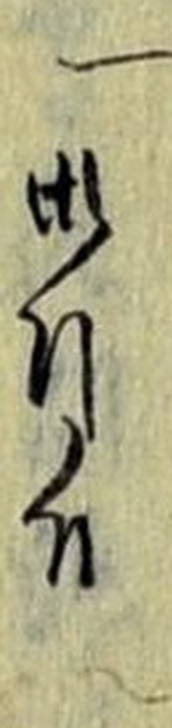御目付
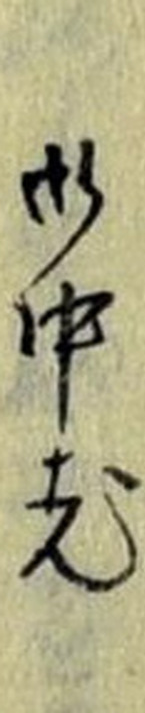御中老
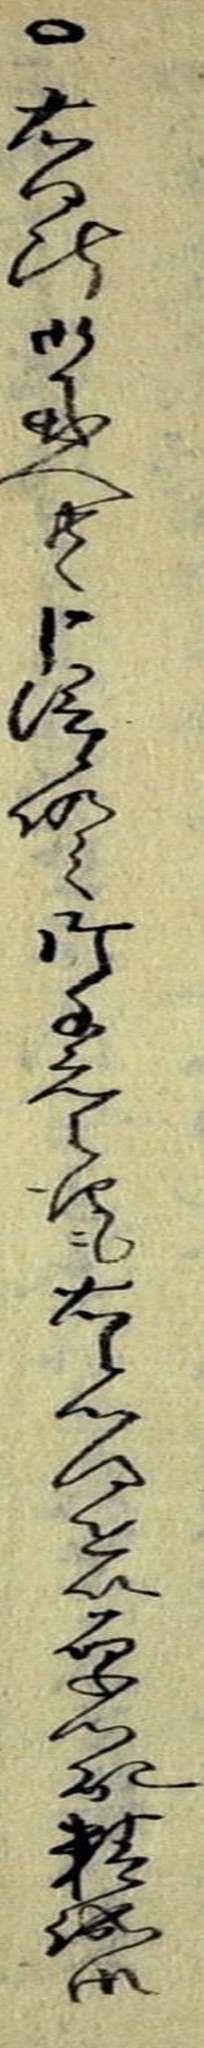○右同断御用人共申渡候仍之御手元之儀も右之心得を以厚心配精誠御
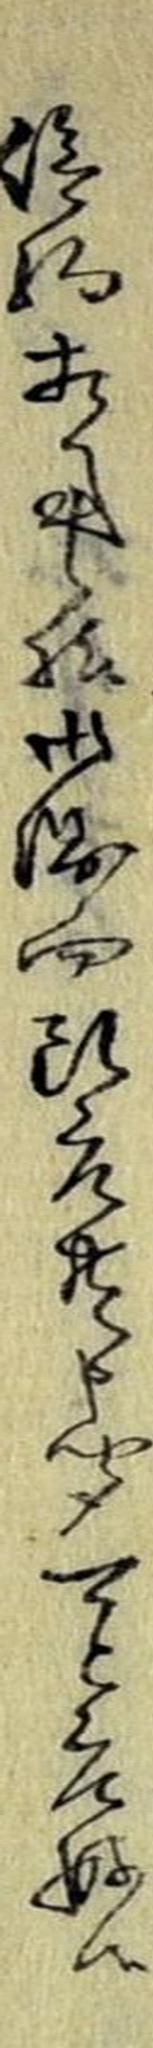倹約相用候様御側向頭取共へ申聞可被取扱候
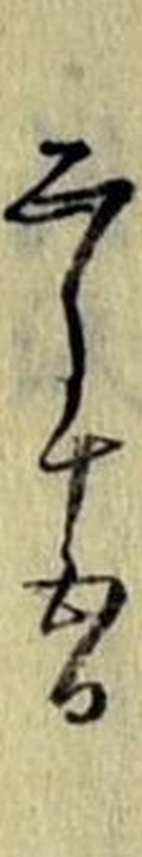正月十五日
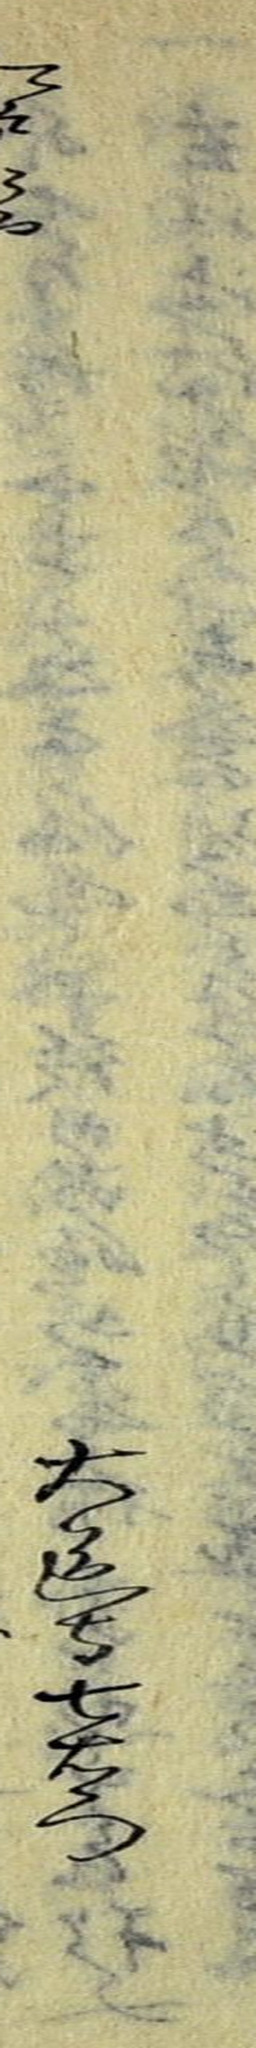江戸ニ而大道寺七右衛門
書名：命令之部 五
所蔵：福井県文書館 Fukui Prefectural Archives
